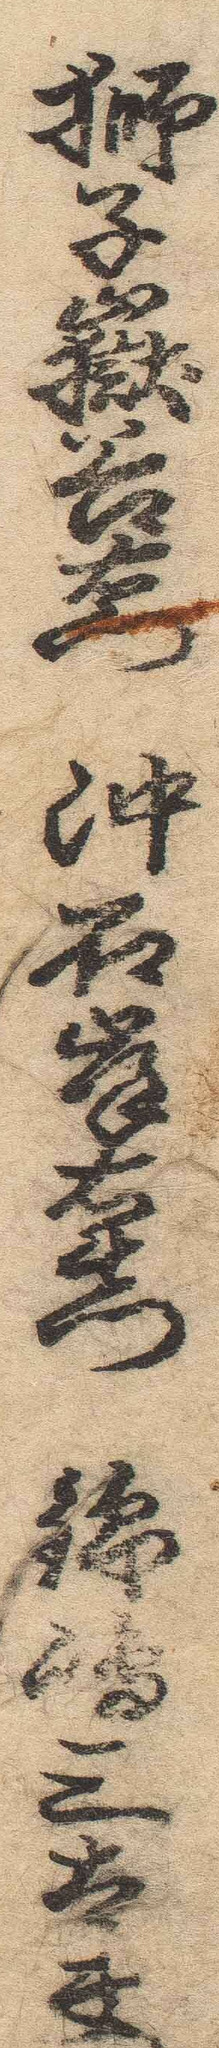獅子嶽谷右衛門沖石峯右衛門錦嶋三太夫
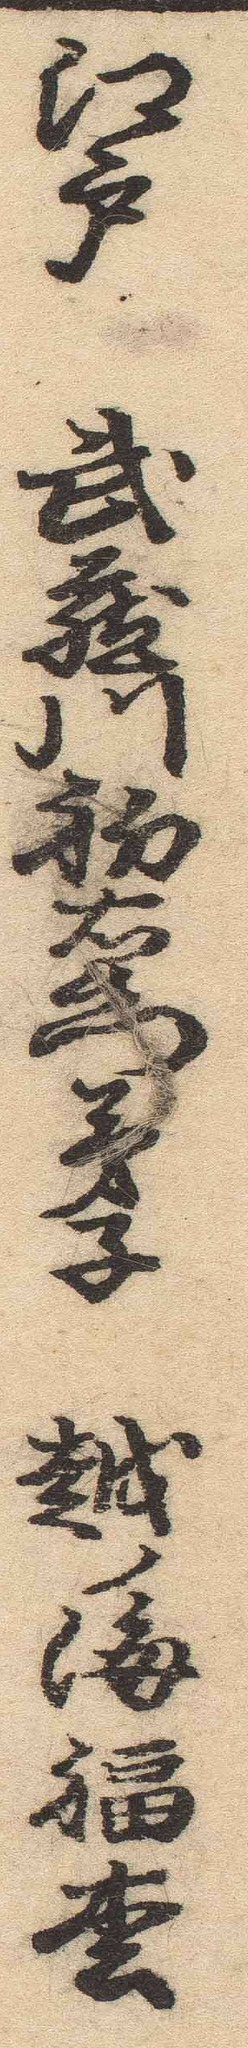江戸武蔵川初右衛門弟子越ノ海福松
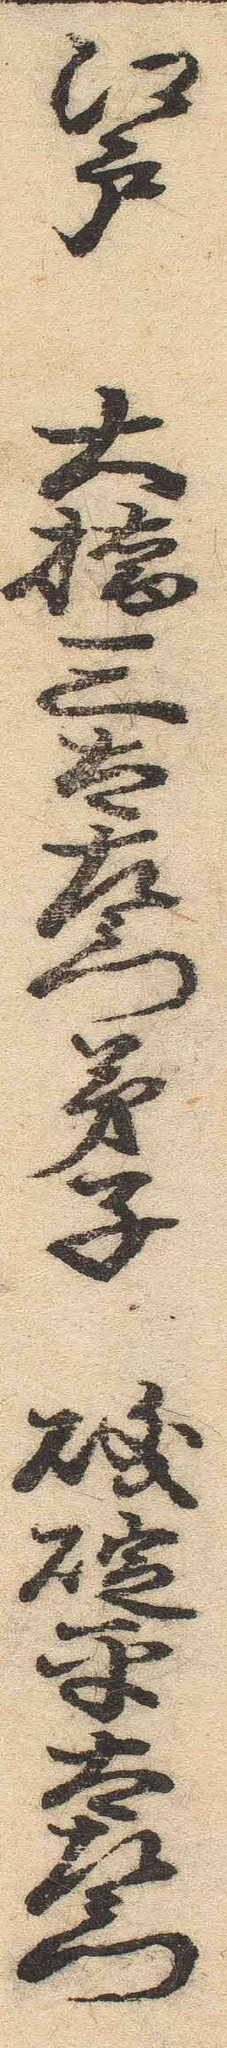江戸大橋三太左衛門弟子磯碇平太左衛門
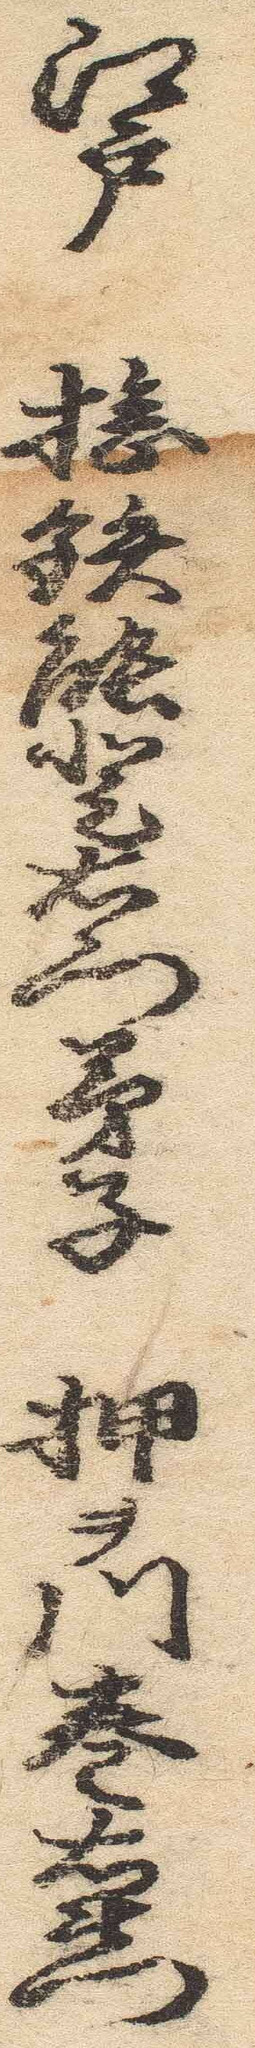江戸捻鉄能登右衛門弟子押ヲ川巻右衛門
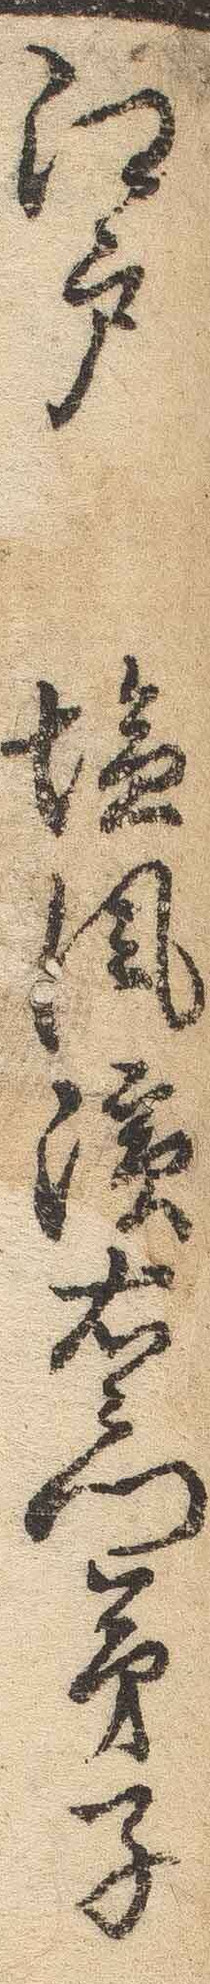江戸塩風浜右衛門弟子
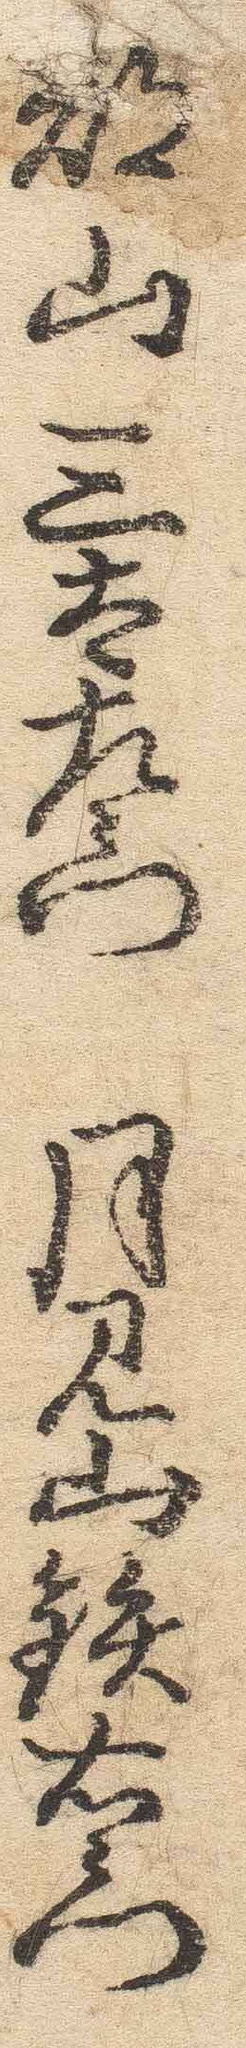郡山三太左衛門月見山鉄右衛門
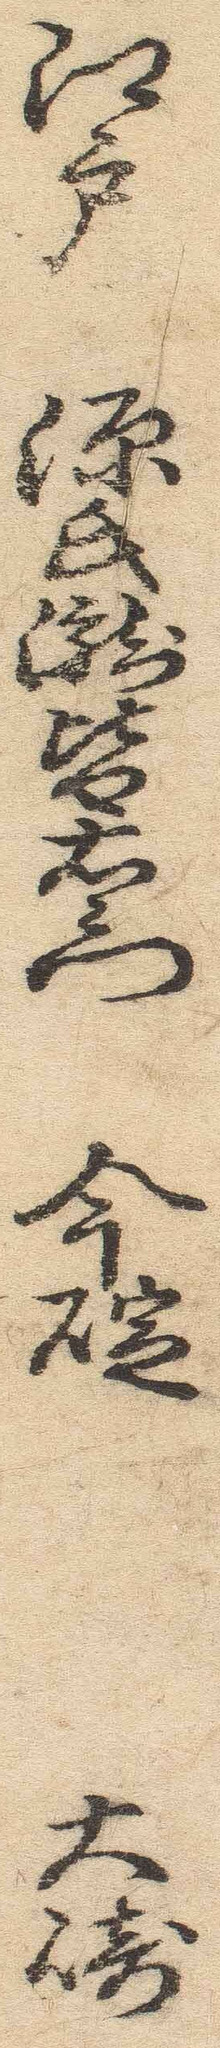江戸源氏瀧皆右衛門今碇大崎
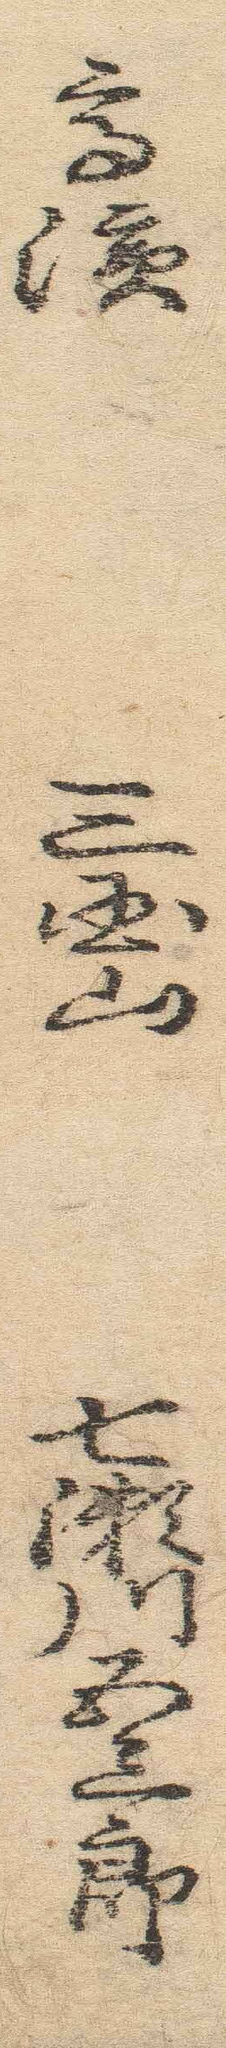高浜三国山七瀬川五三郎
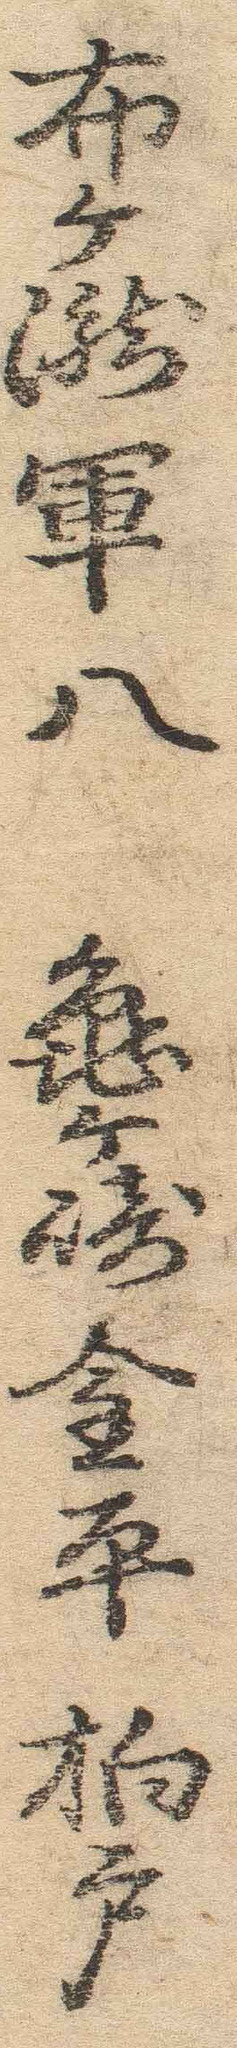布ケ瀧軍八亀ケ崎金平柏戸
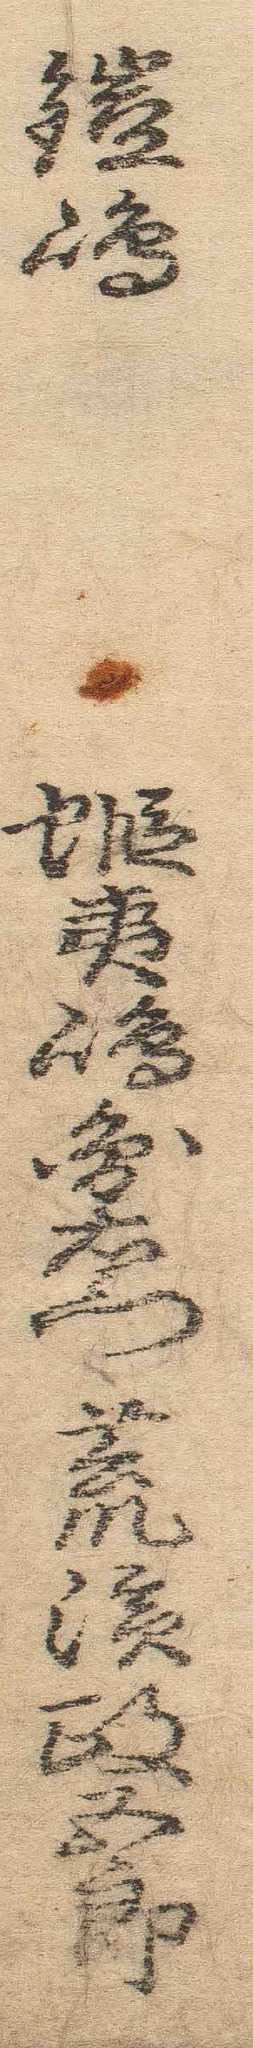鎧嶋蝦夷嶋団右衛門荒浜政五郎
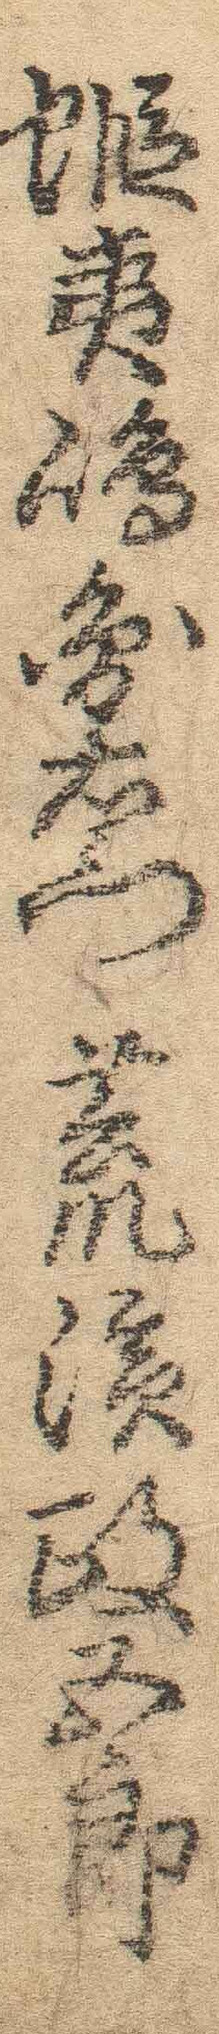鎧嶋蝦夷嶋団右衛門荒浜政五郎
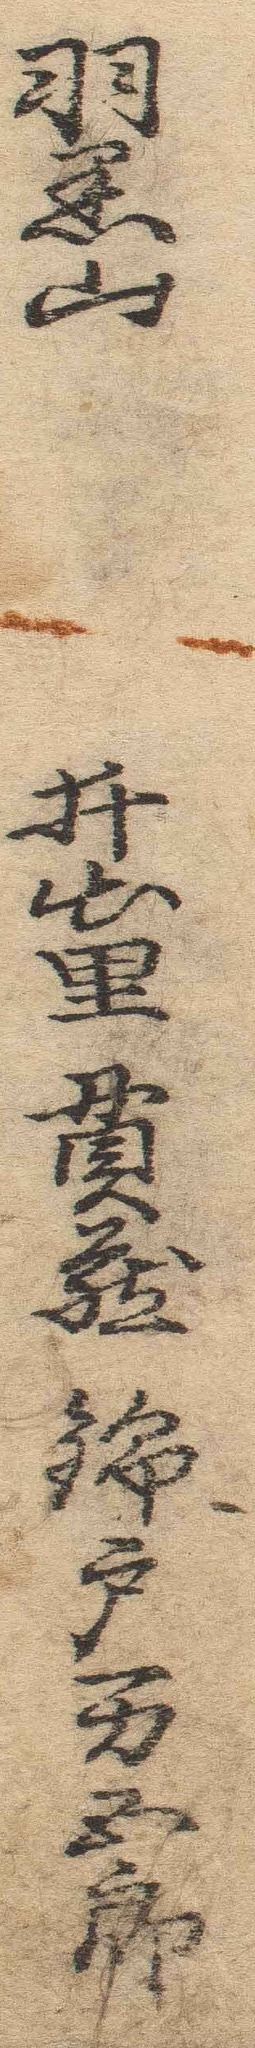羽黒山井出里貫蔵錦戸万五郎
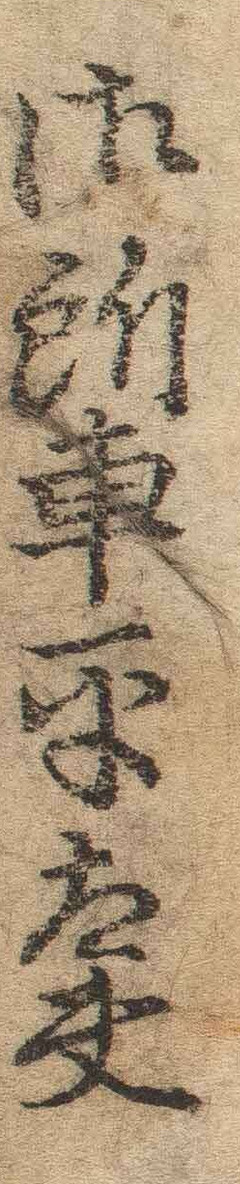御所車平太夫

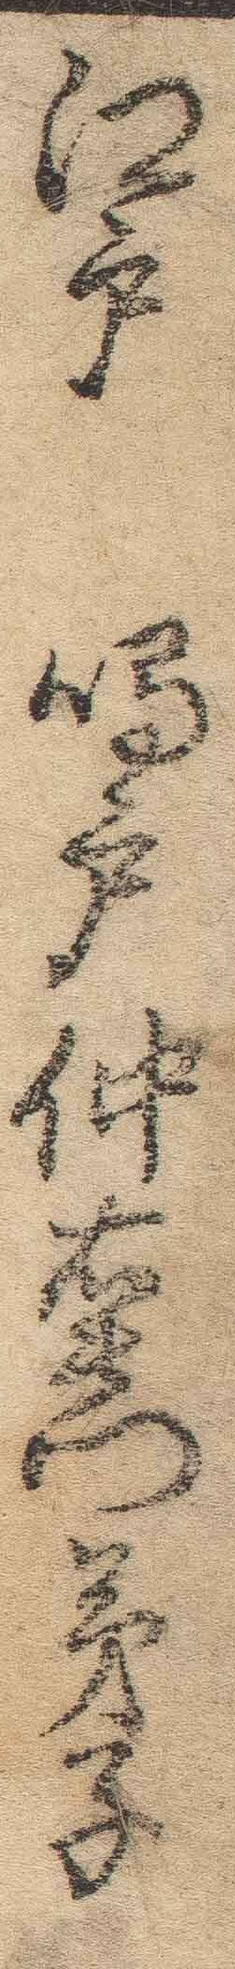江戸鳴門仲右衛門弟子
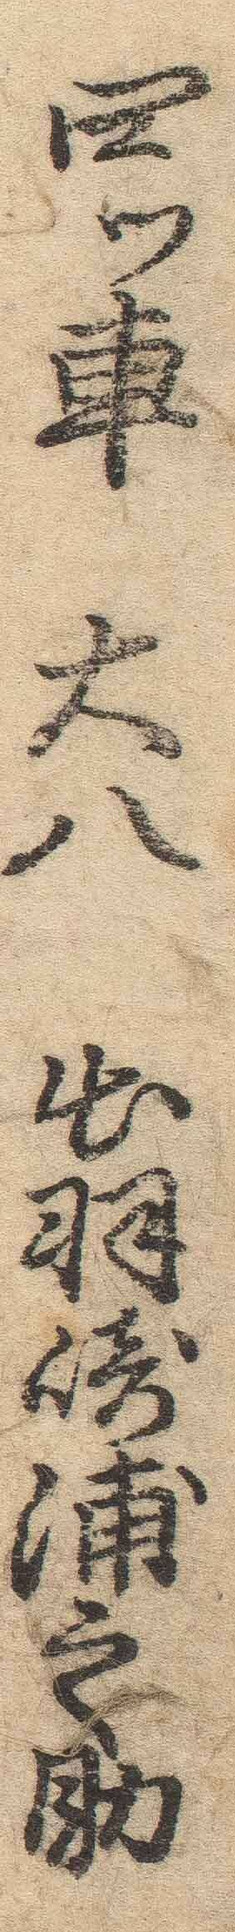四ツ車大八出羽崎浦之助
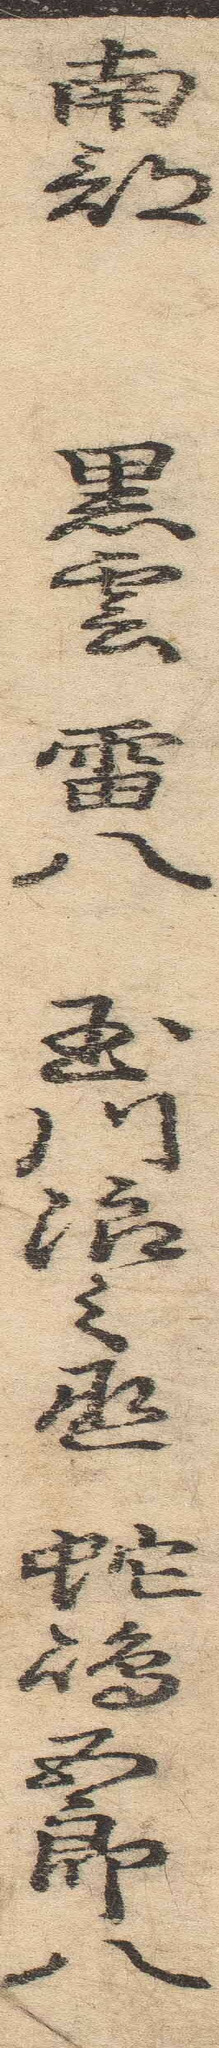南部黒雲雷八玉川浪之丞蛇嶋五郎八
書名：古今相撲大全
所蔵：東京学芸大学附属図書館 国文学研究資料館
